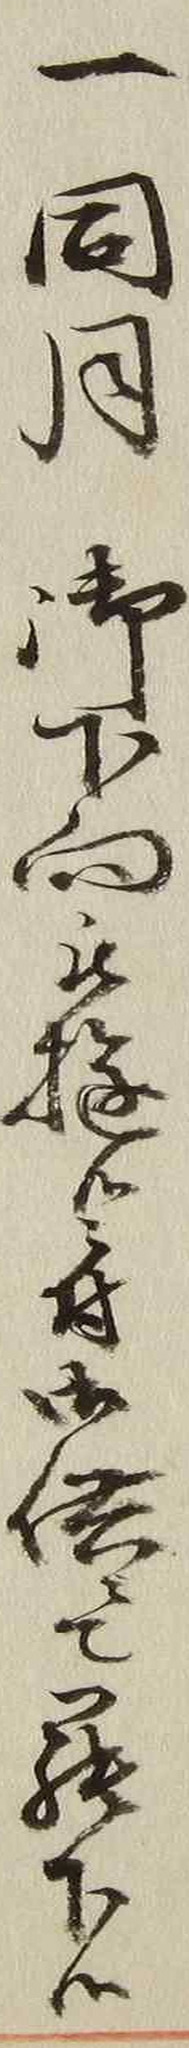一同月御下向被遊候ニ付御供ニて罷下候
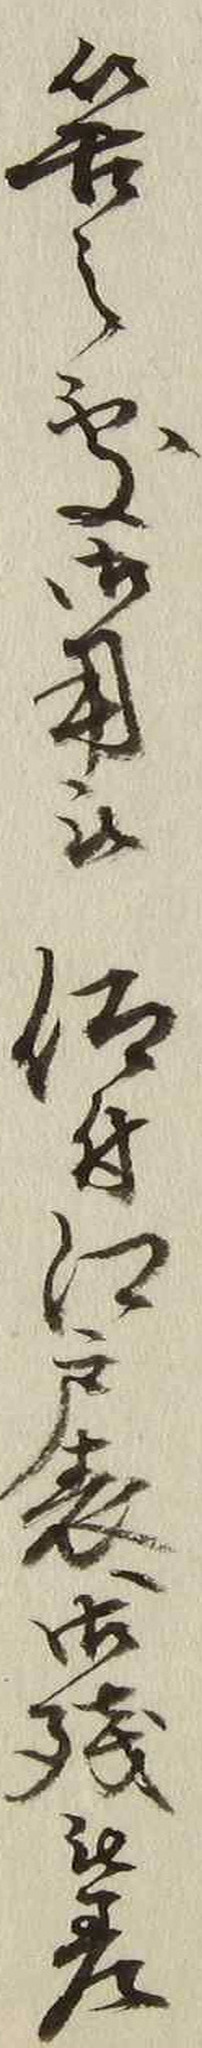筈之処御用被仰付江戸表へ御残被差
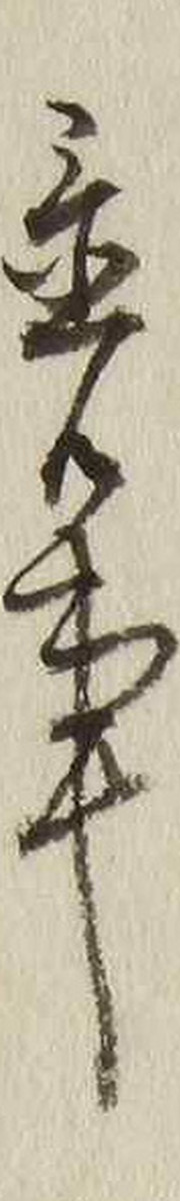置候事
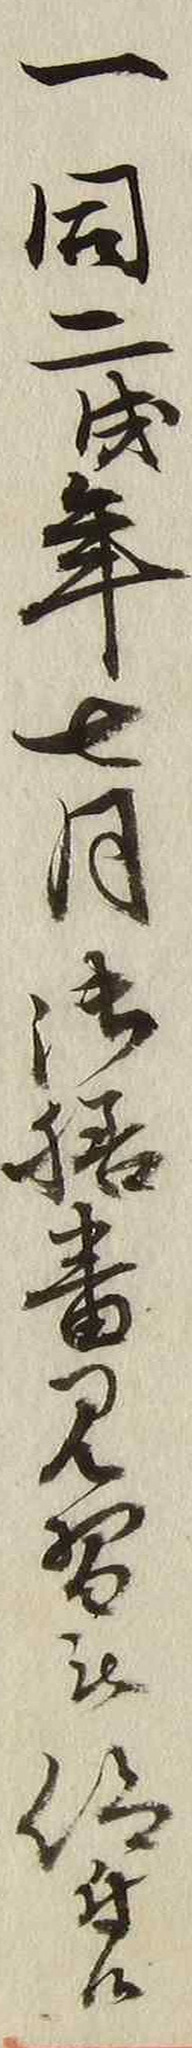一同二戌年七月御膳番見習被仰付候
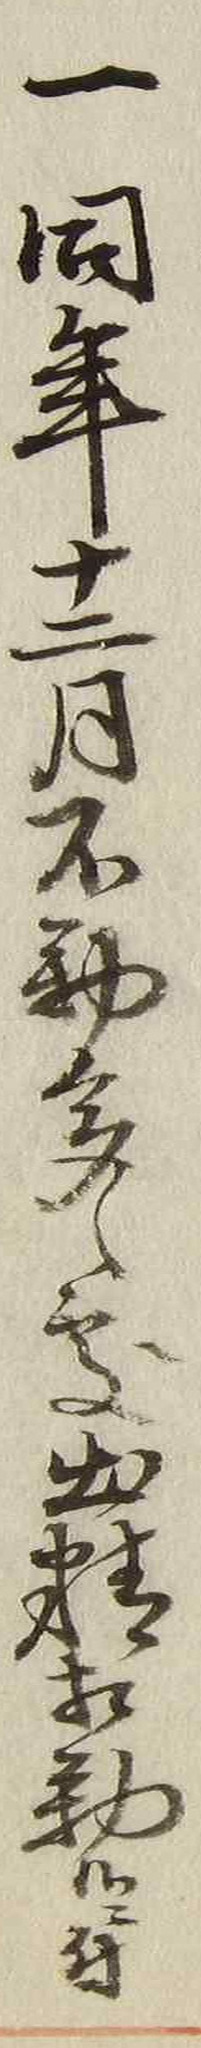一同年十二月不勤多候処出精相勤候ニ付
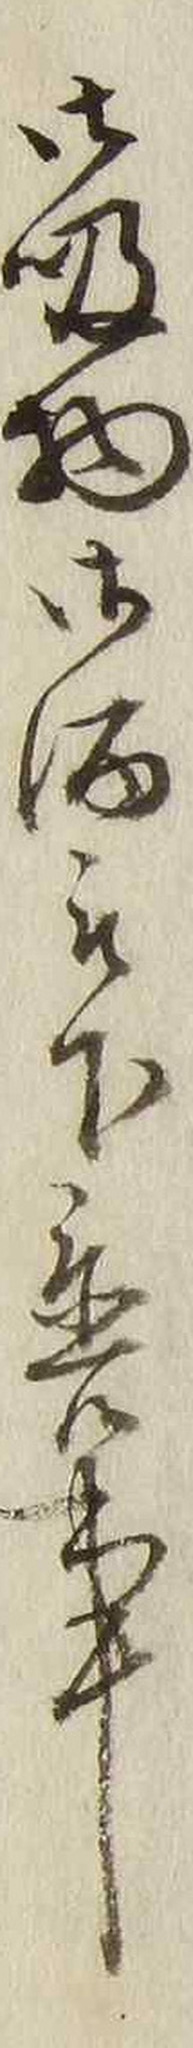御吸物御酒被下置候事
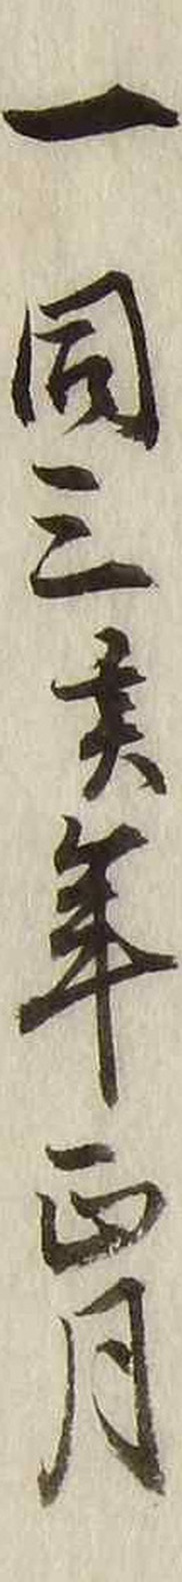一同三亥年正月
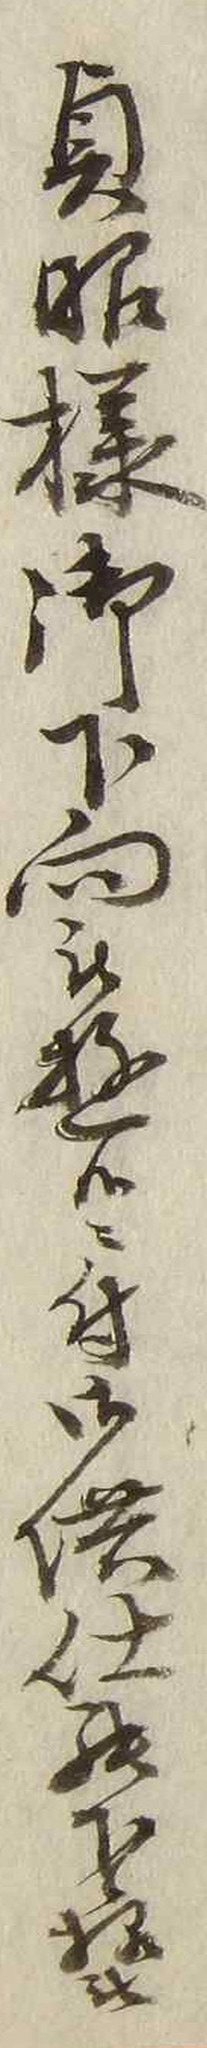貞昭様御下向被遊候ニ付御供仕罷下候様被

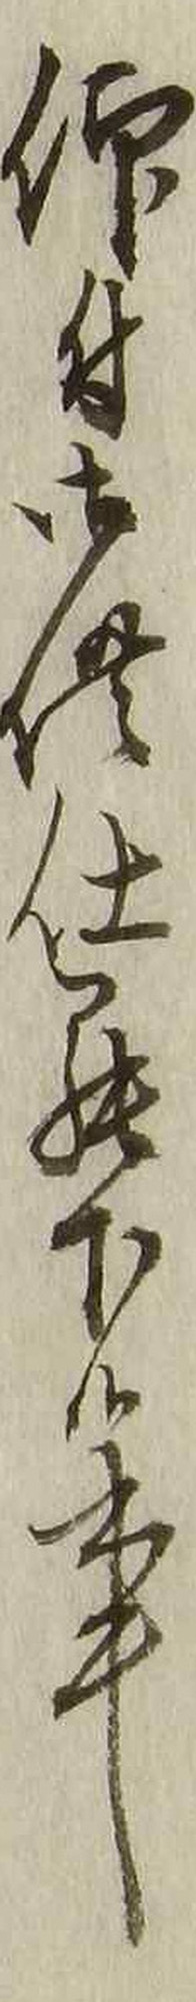仰付御供仕罷下候事
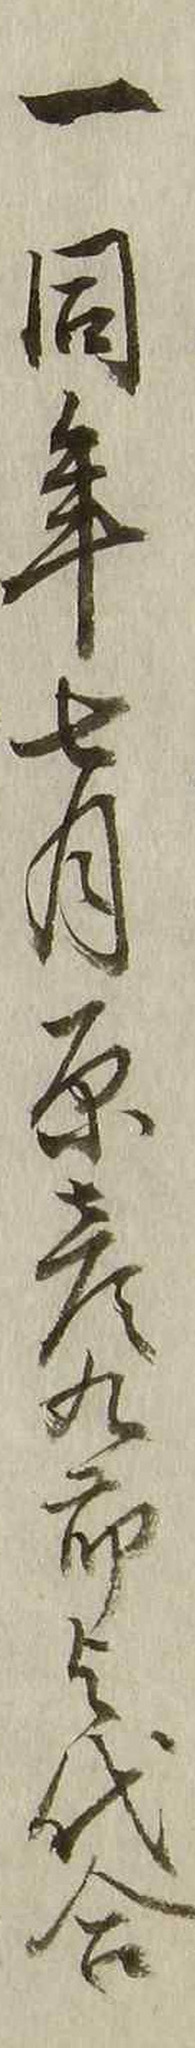一同年七月原彦九郎与代合
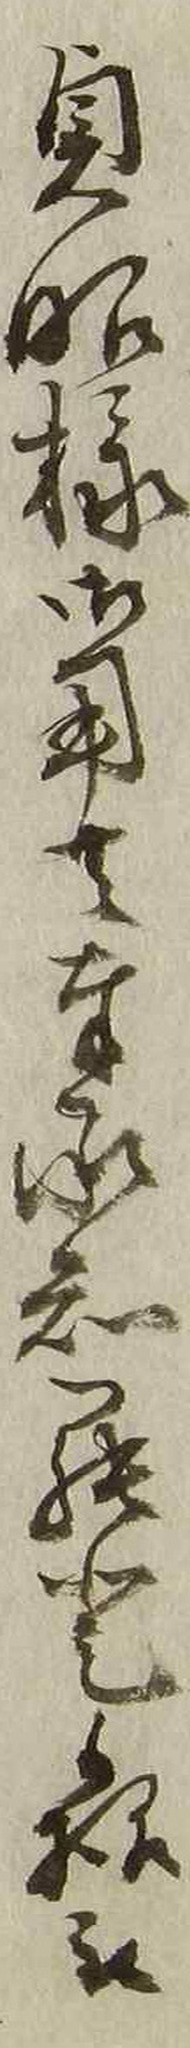貞昭様御用者奉承知罷登候様被
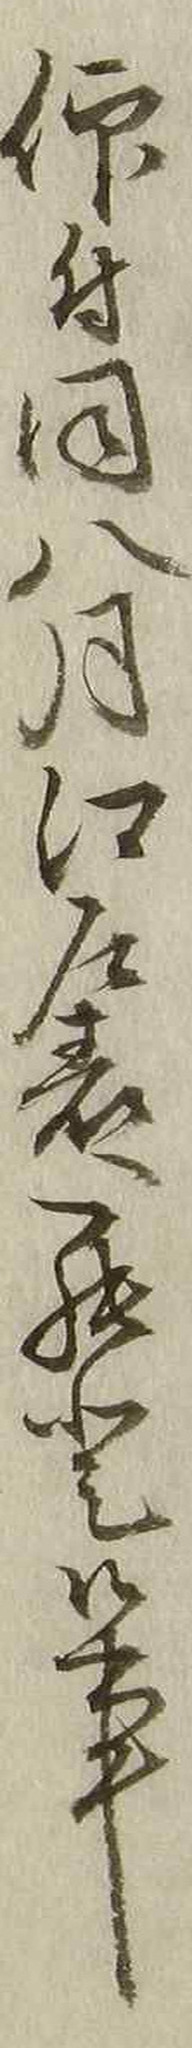仰付同八月江戸表へ罷登候事
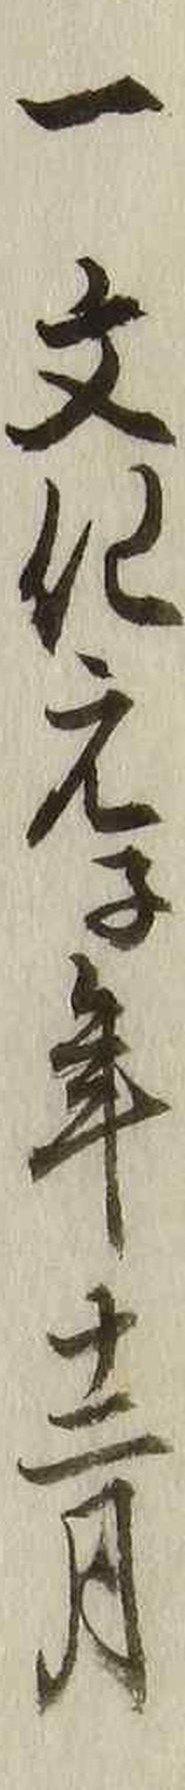一文化元子年十二月
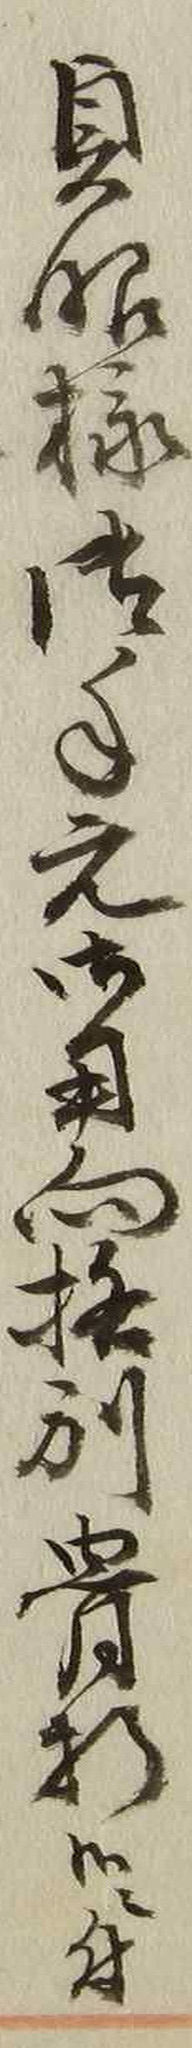貞昭様御手元御用向格別骨折候ニ付
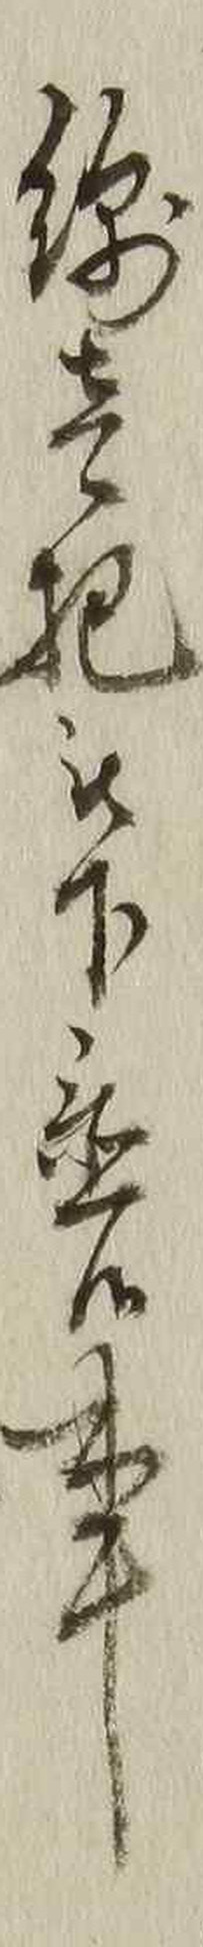綿壱把被下置候事
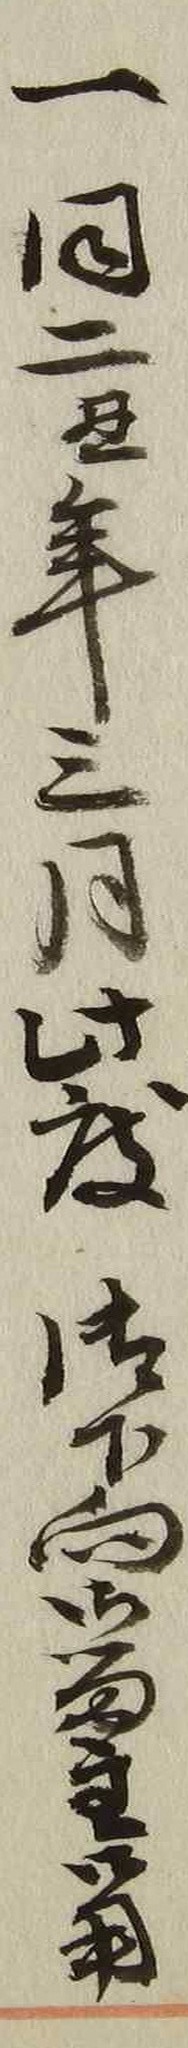一同二丑年三月此度御下向御留主御用
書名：諸士系譜　巻之23　い之部23
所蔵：会津若松市立会津図書館
